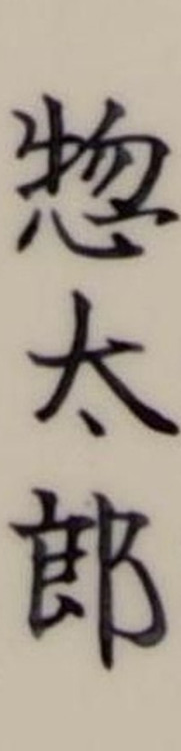惣太郎
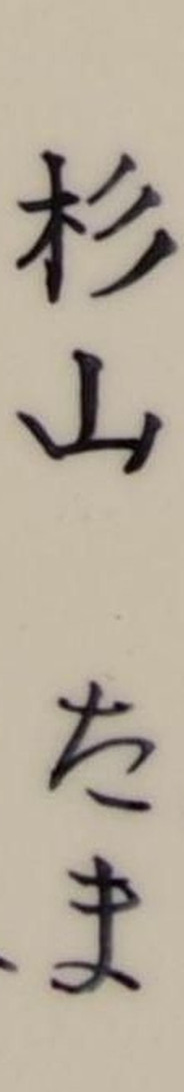杉山たま

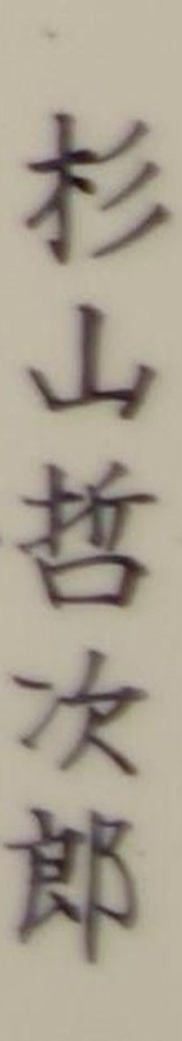杉山哲次郎
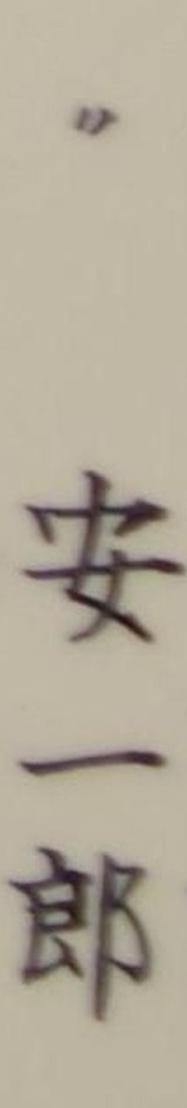安一郎
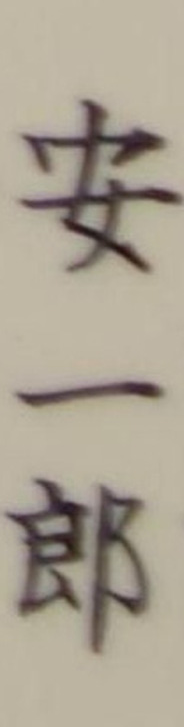安一郎
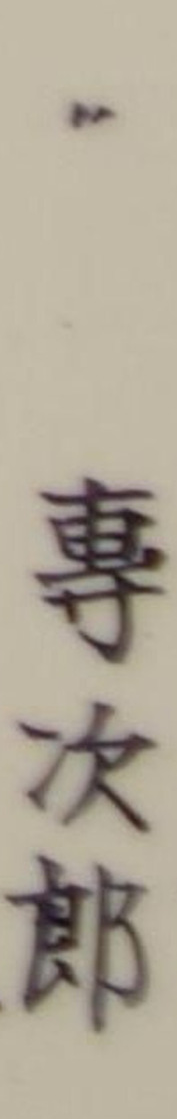専次郎
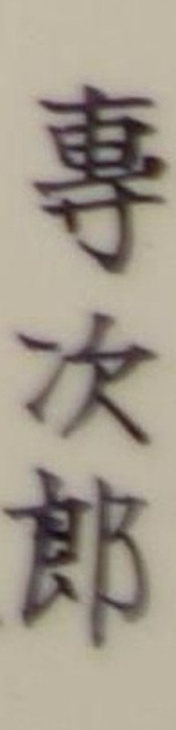専次郎
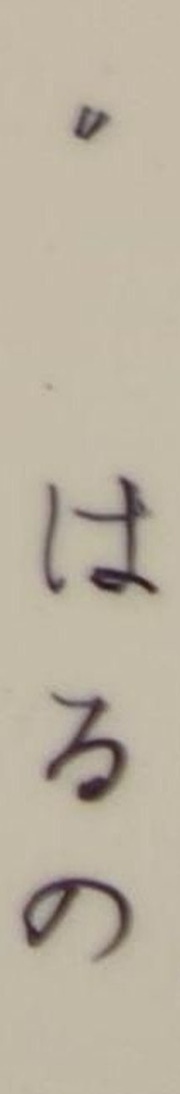はるの
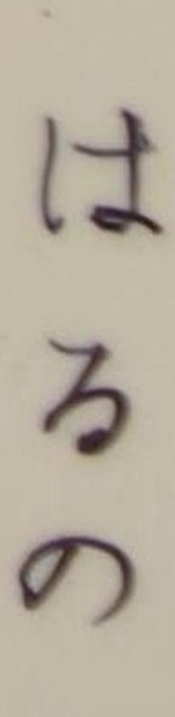はるの
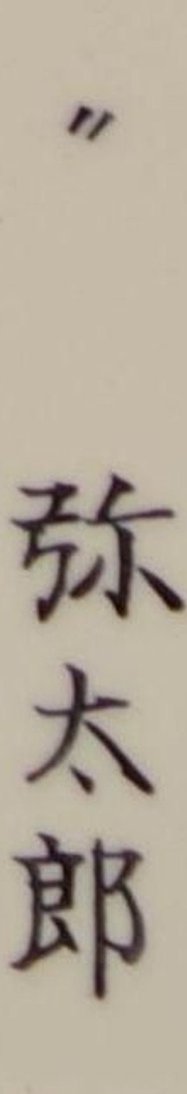弥太郎
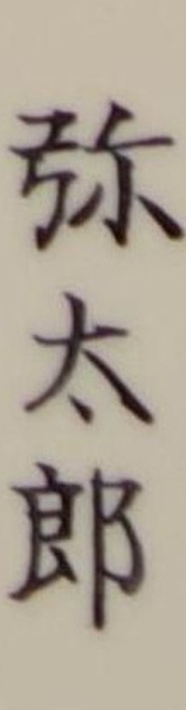弥太郎
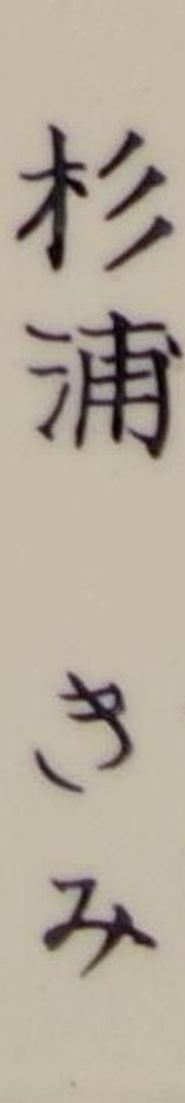杉浦きみ
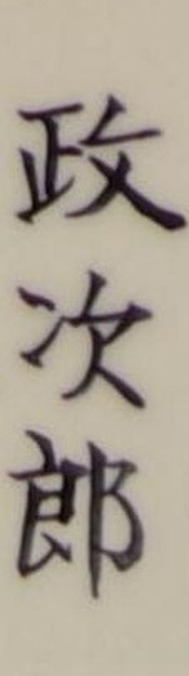政次郎
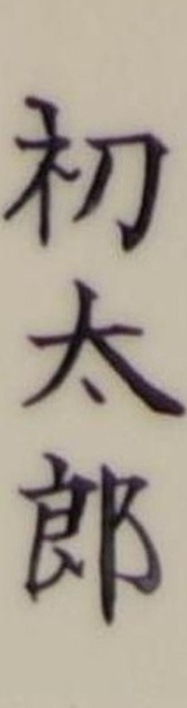初太郎
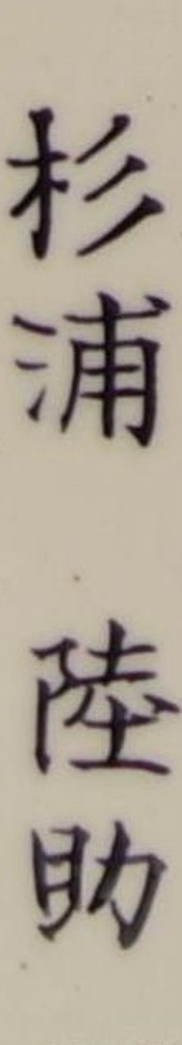杉浦陸助

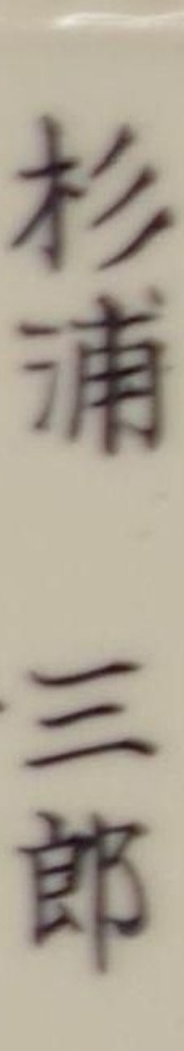杉浦三郎
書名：M~S
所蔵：高野山金剛峯寺
